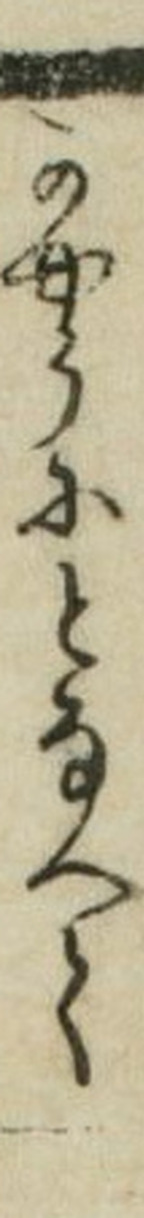このやうにとなへて
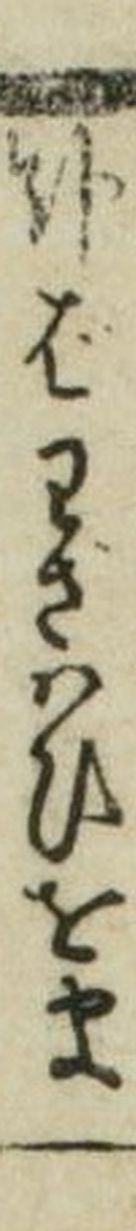臥ばわざはひをま
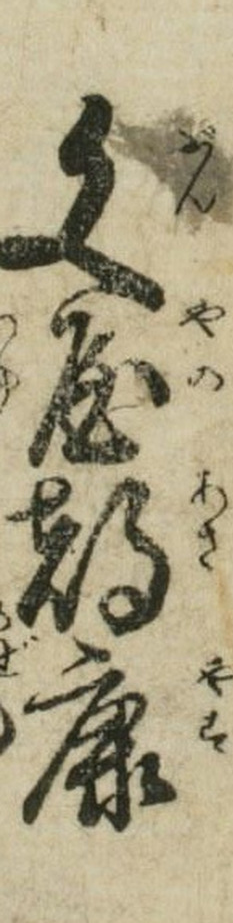文屋朝康
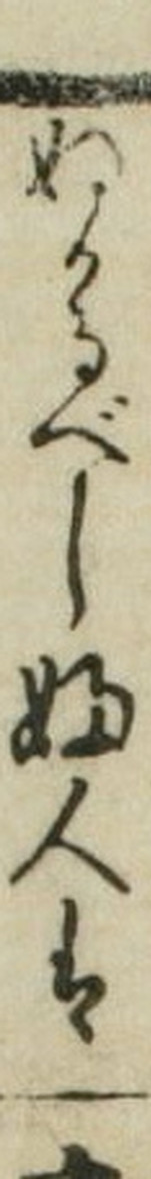ぬかるべし婦人は
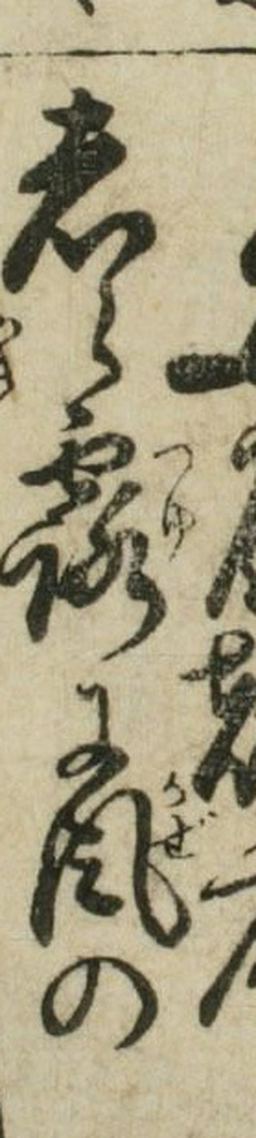しら露に風の
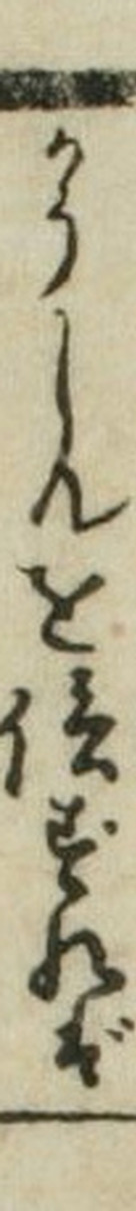かうしんを信ずれば
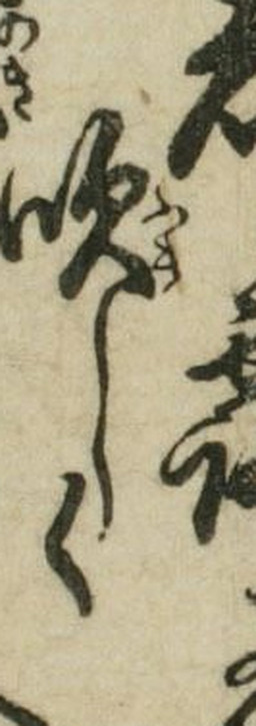吹しく
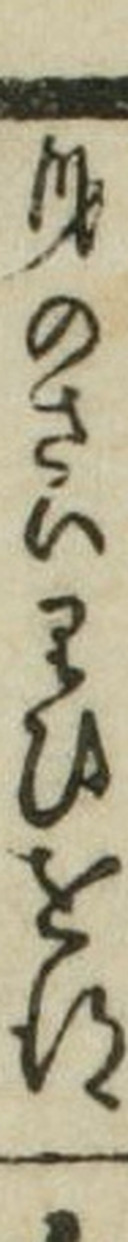身のさいわひを得
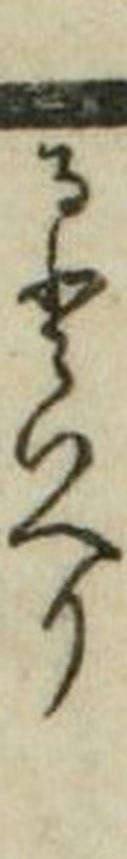るといへり
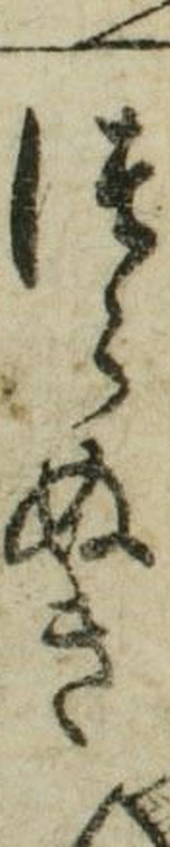つらぬき
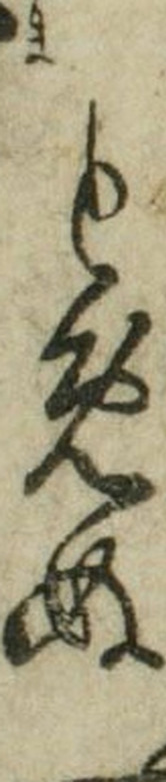とめぬ
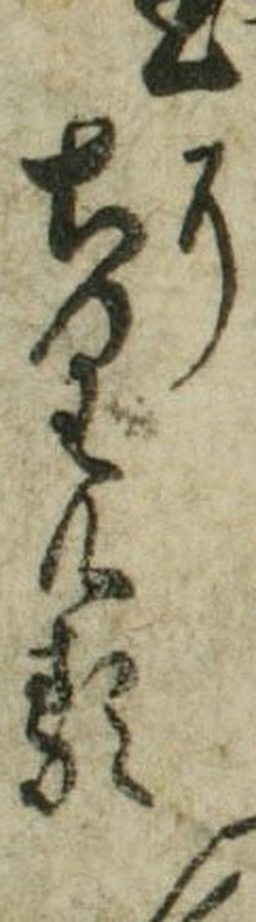ちりける

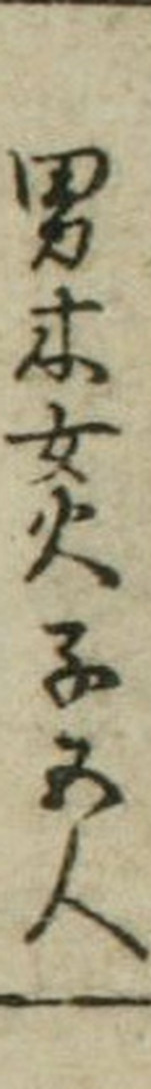男木女火子五人
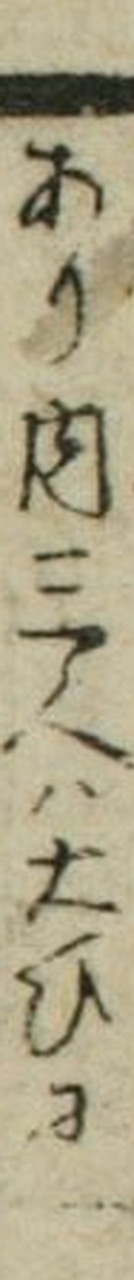あり内三人は大ひに
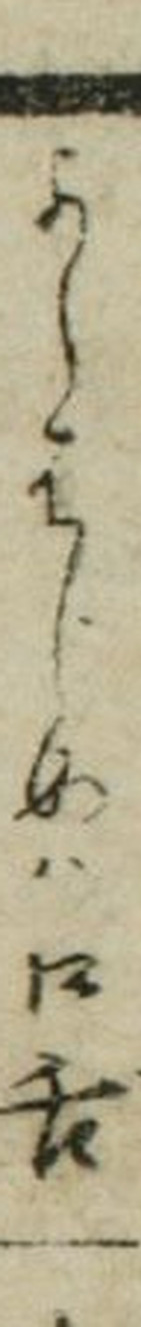よしはじめは口舌
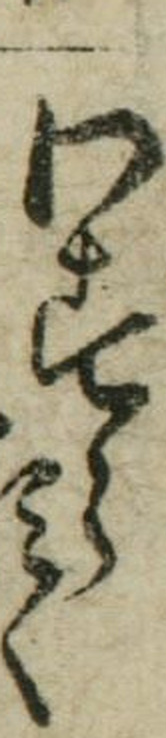わすら
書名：百人一首
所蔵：東京学芸大学教育コンテンツアーカイブ
